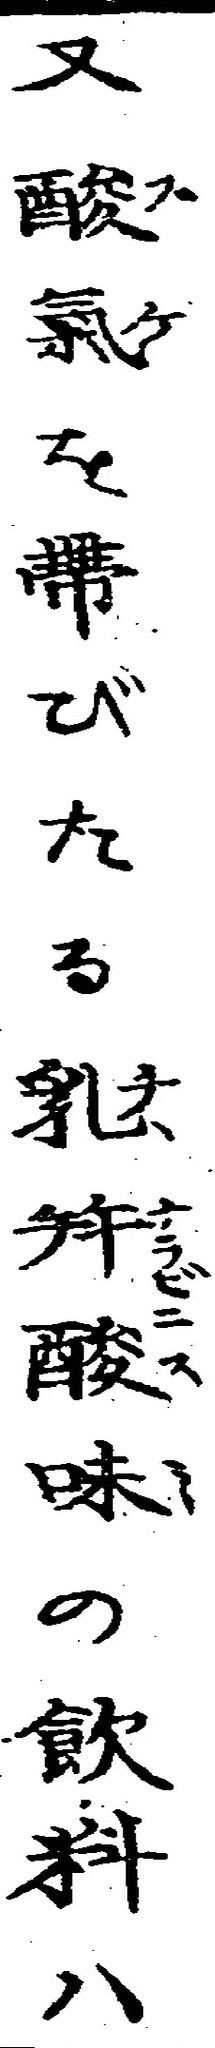又酸氣を帶びたる乳幷酸味の飲料は
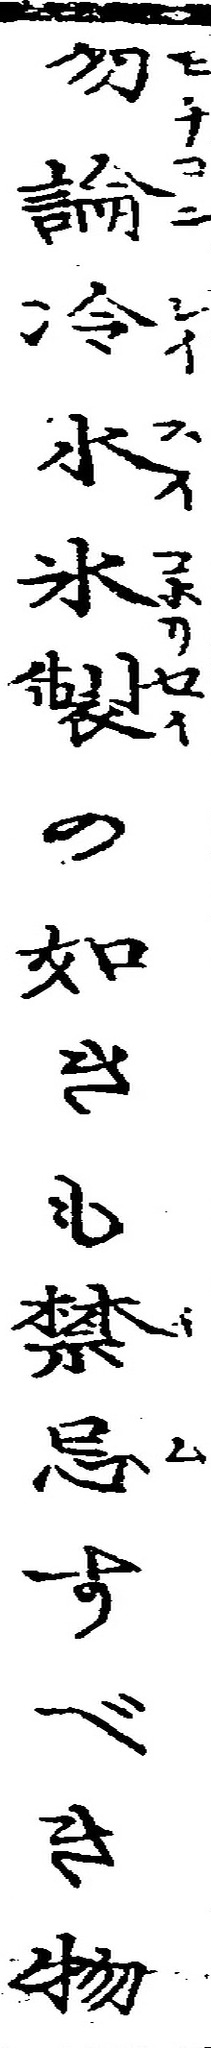勿論冷水氷製の如きも禁忌すべき物
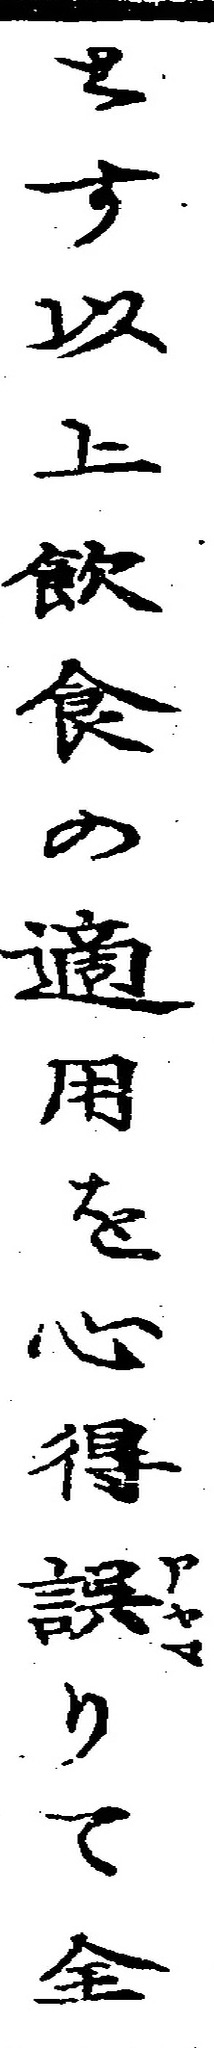とす以上飲食の適用を心得誤りて全
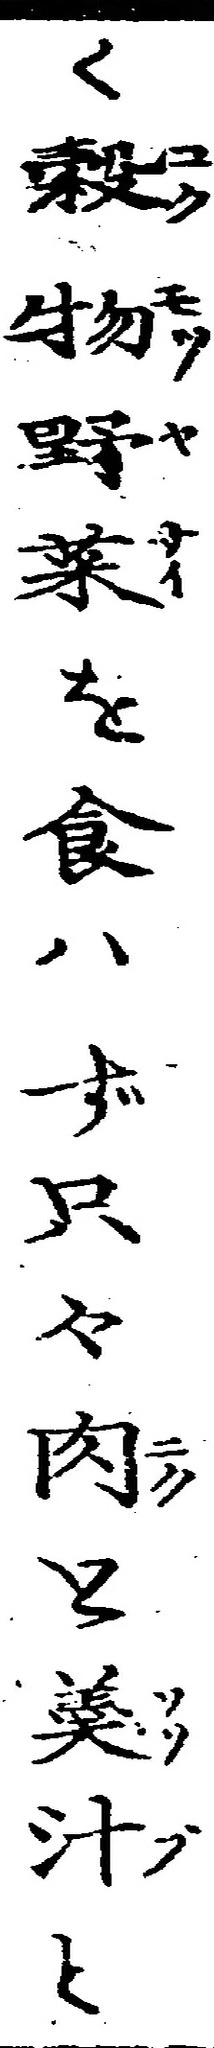く穀物野菜を食はず只々肉と羹汁と
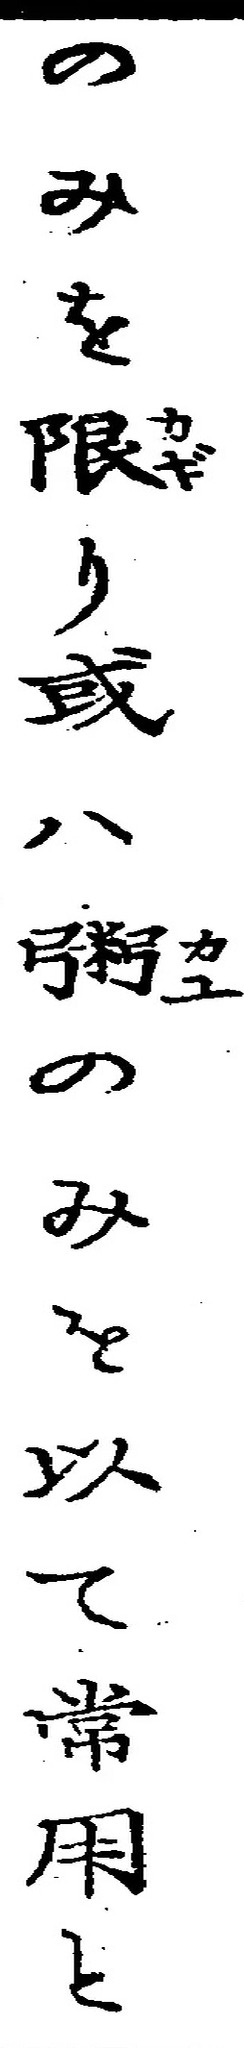のみを限り或は粥のみを以て常用と
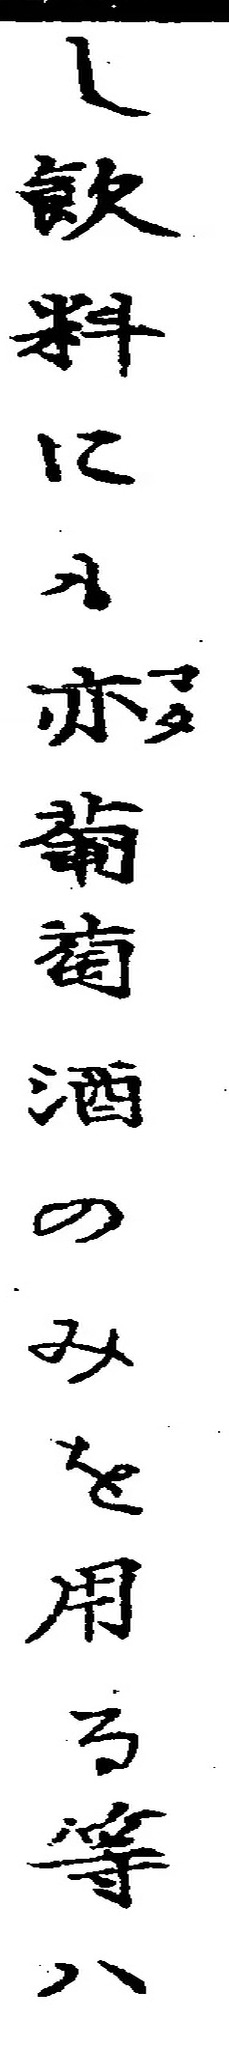し飲料にも亦葡萄酒のみを用る等は
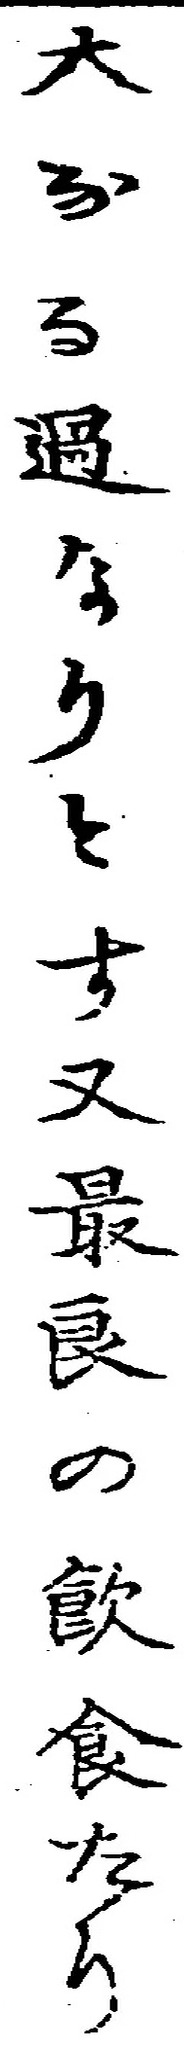大なる過なりとす又最良の飲食たり
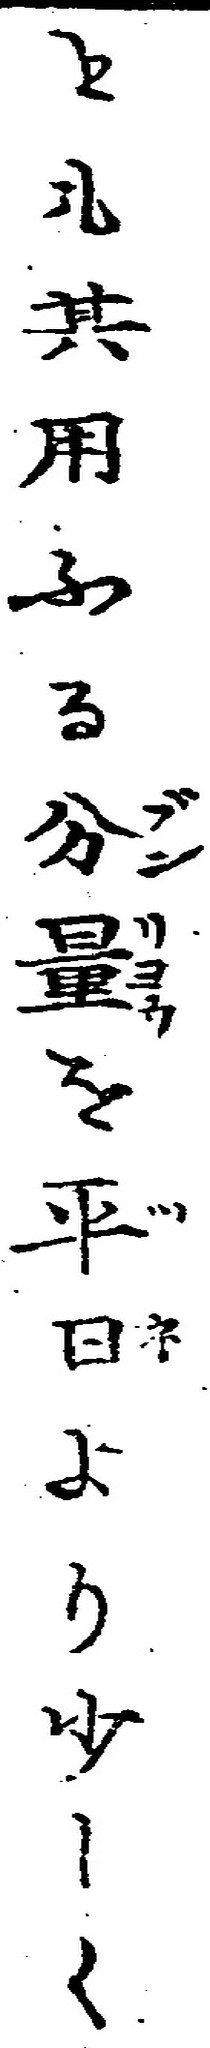とも其用ふる分量を平日より少しく
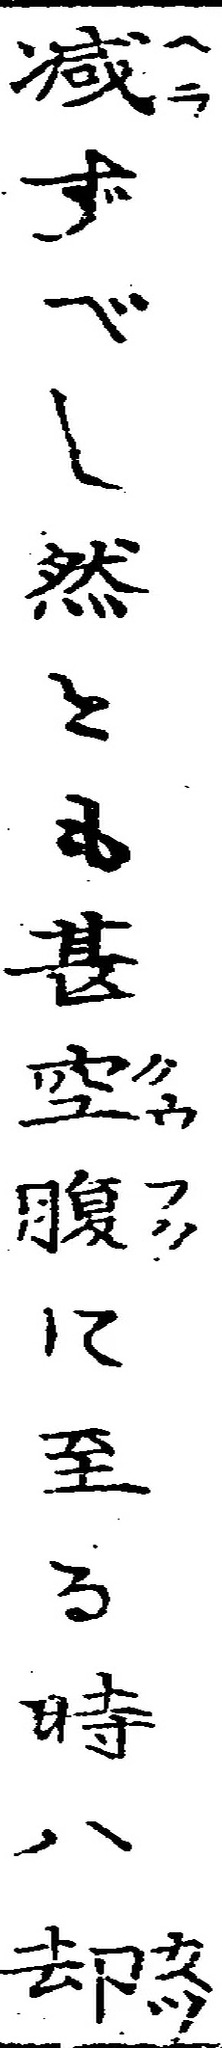減ずべし然とも甚空腹に至るときは却

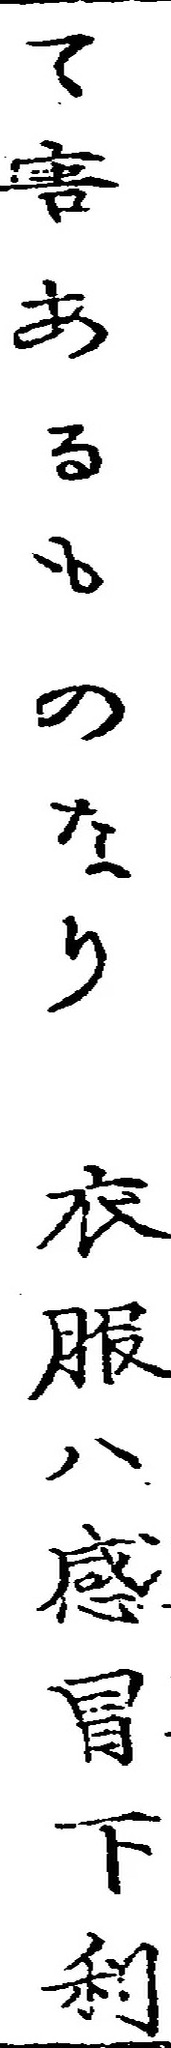て害あるものなり衣服は感冒下利
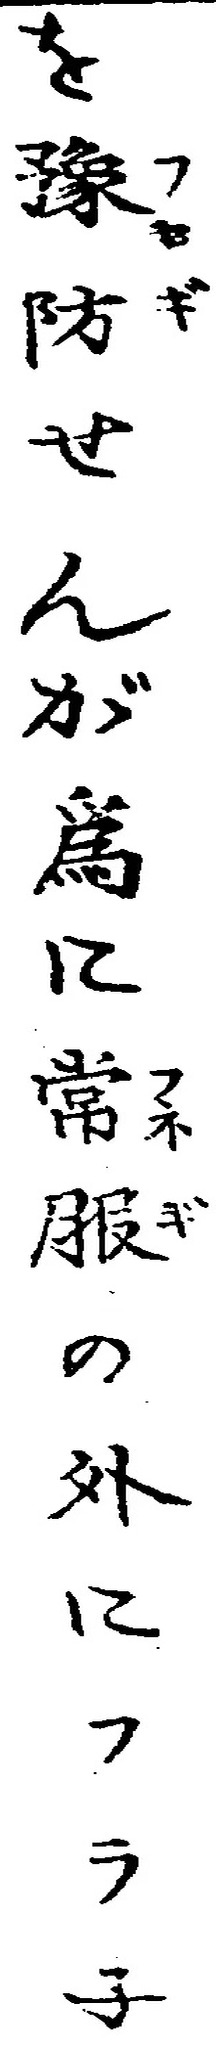を豫防せんが為に常服の外にフラネ
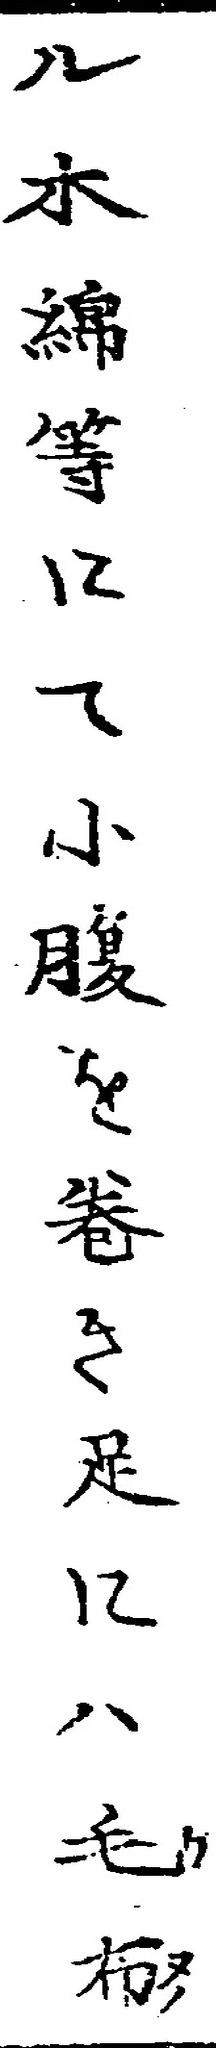ル木綿等にて小腹を巻き足には毛布
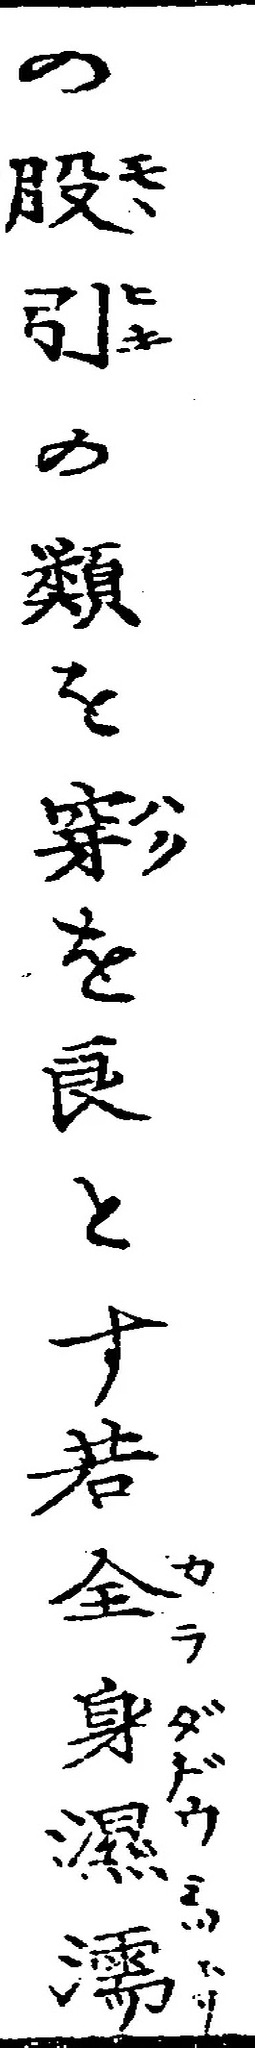の股引の類を穿を良とす若全身濕濡
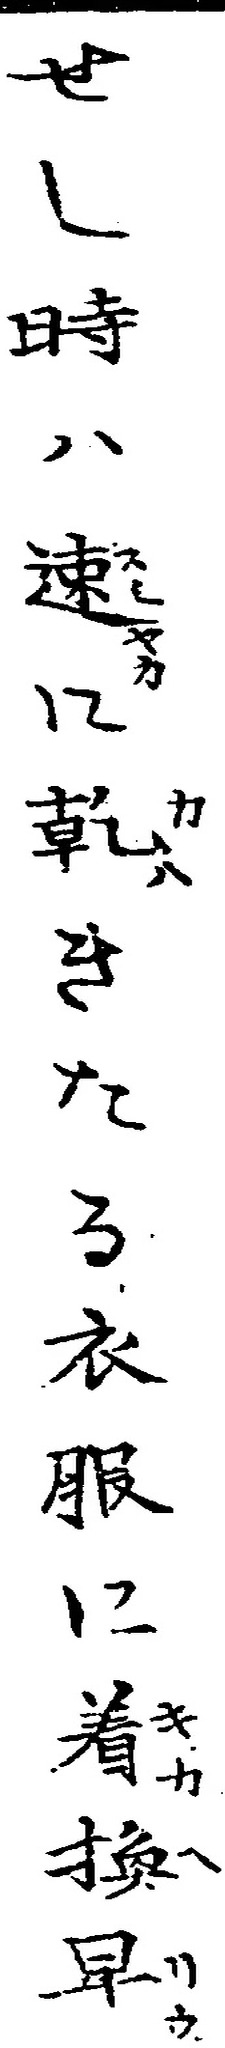せし時は速に乾きたる衣服に着換早
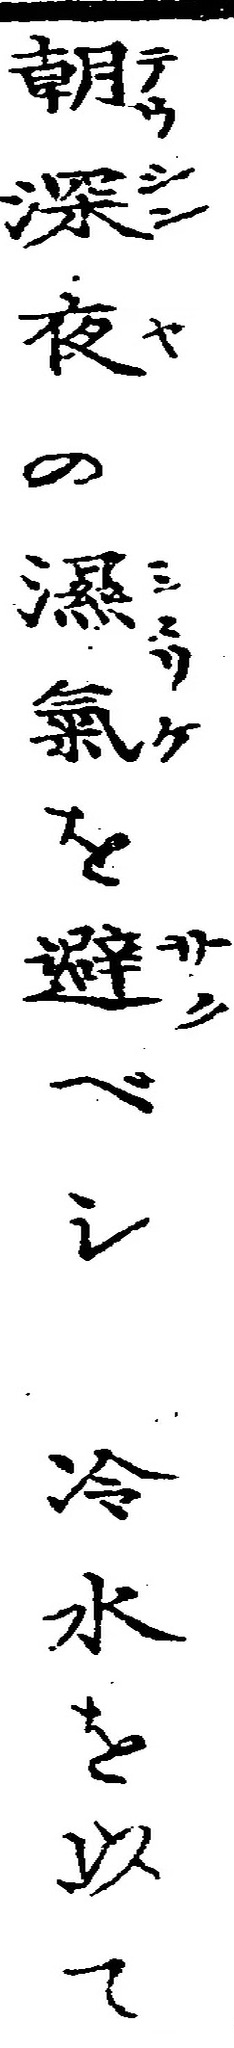朝深夜の濕氣を避べし冷水を以て
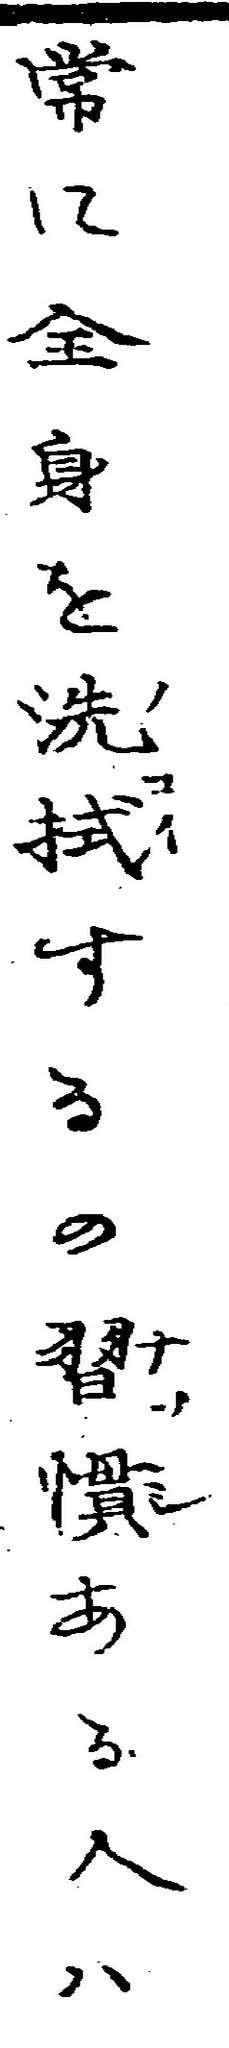常に全身を洗拭するの習慣ある人は
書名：虎列剌病予防用法
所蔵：国立国会図書館 National Diet Library, JAPAN
